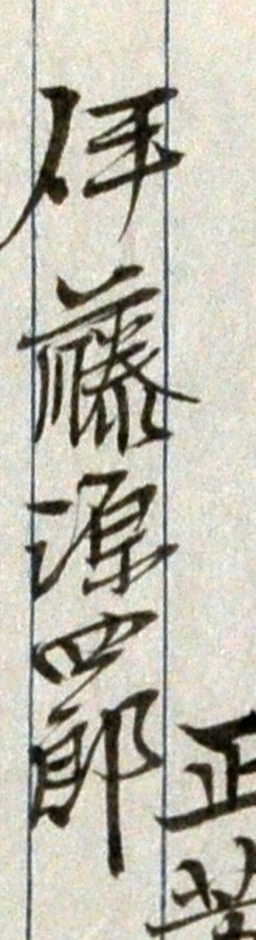伊藤源四郎
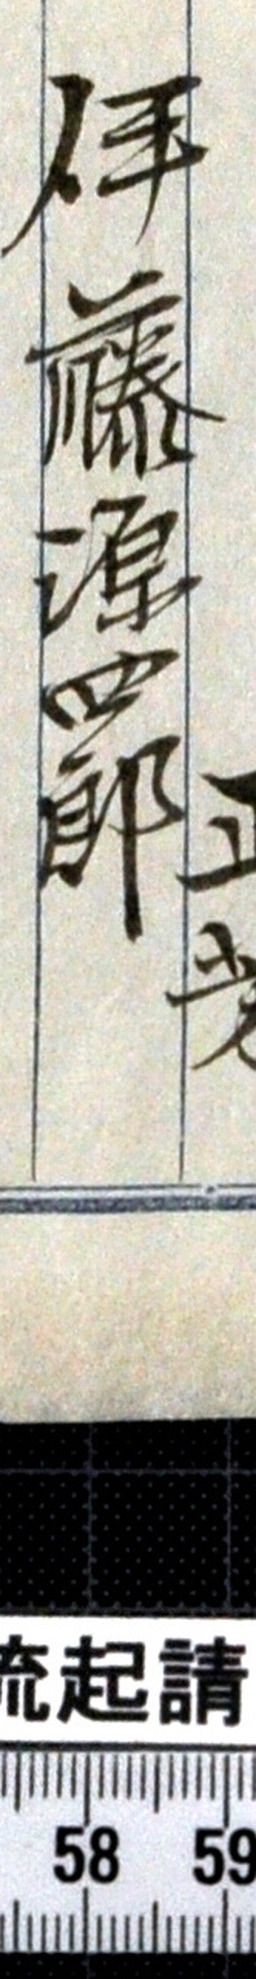伊藤源四郎
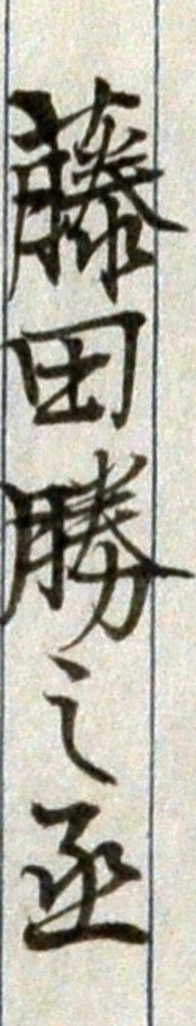藤田勝之丞
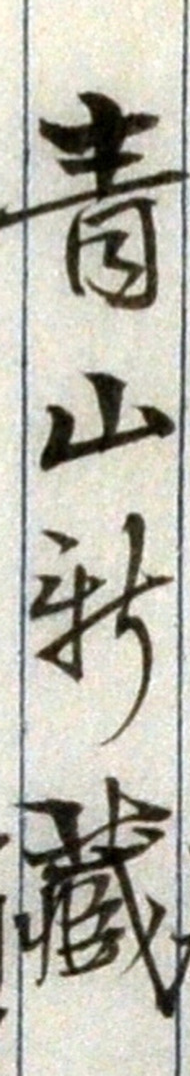青山新蔵
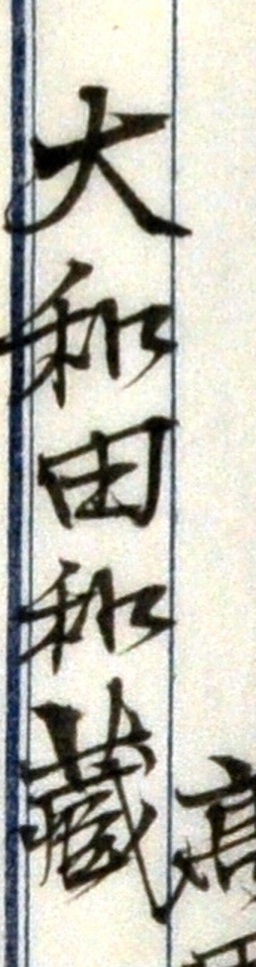大和田和蔵
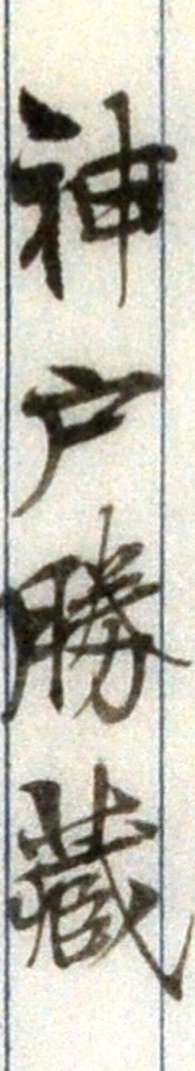神戸勝蔵
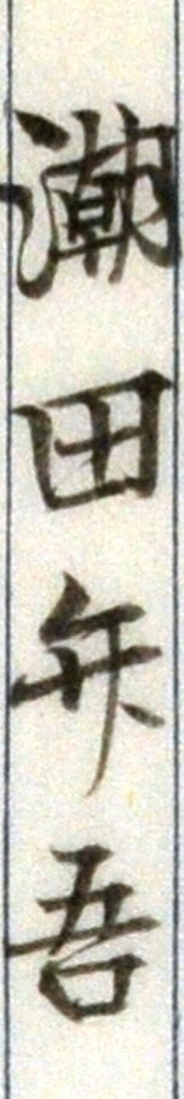潮田弁吉
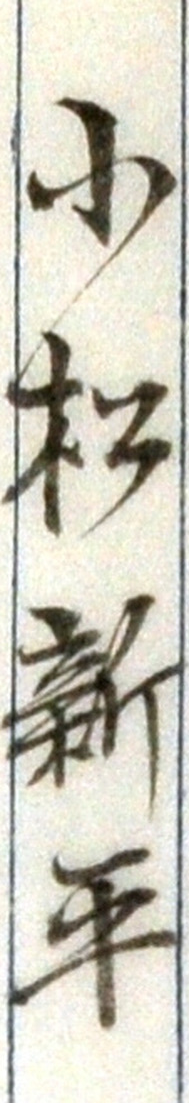小杉新平
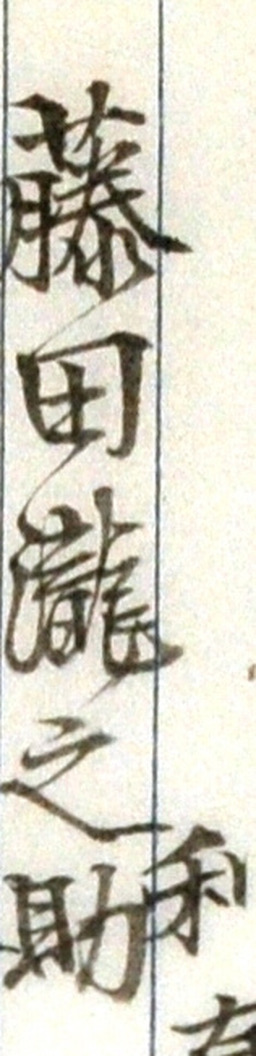藤田瀧之助
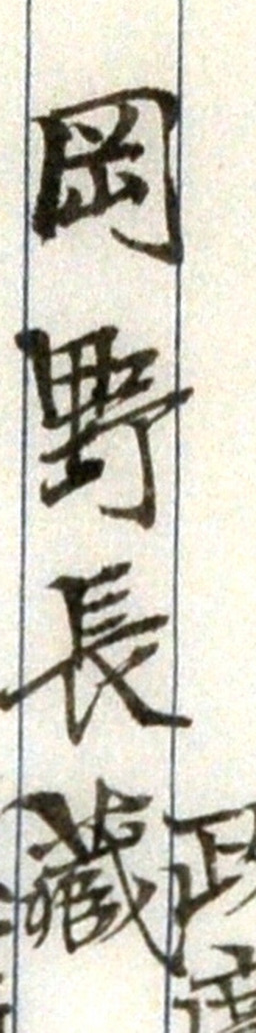岡野長蔵
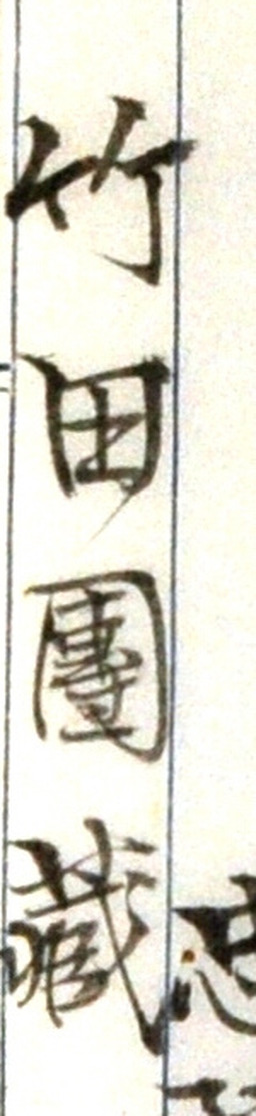竹田団蔵

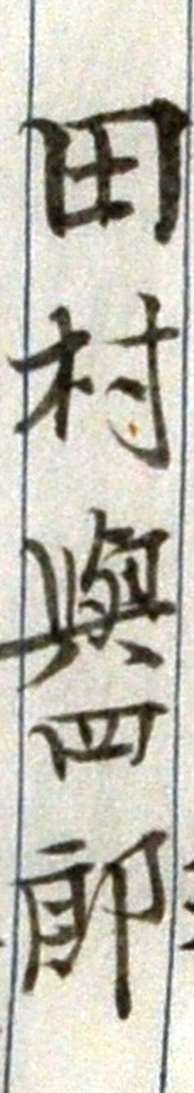田村与四郎
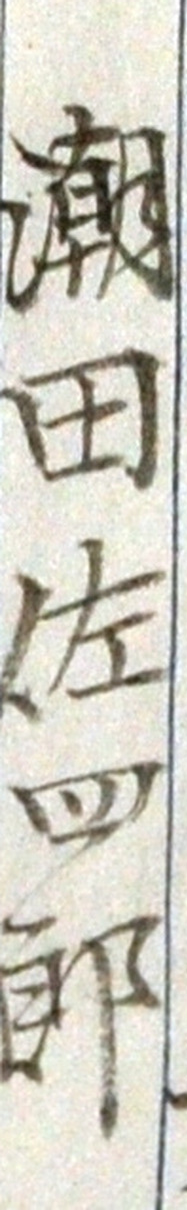潮田佐四郎
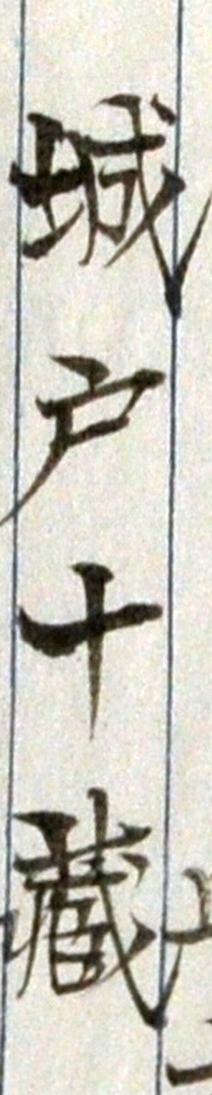城戸十蔵
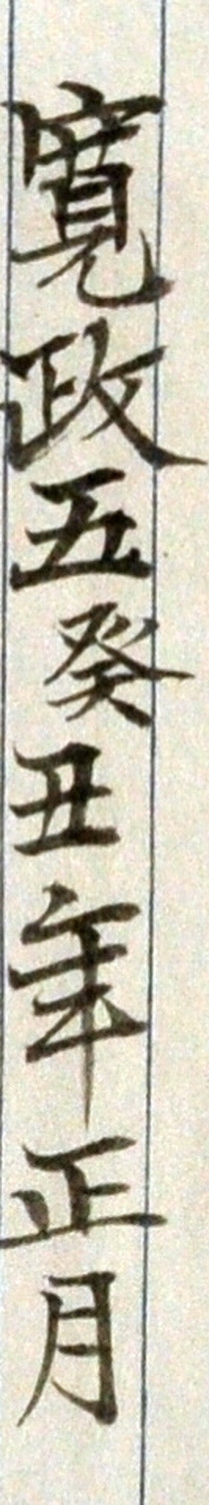寛政五癸丑年正月
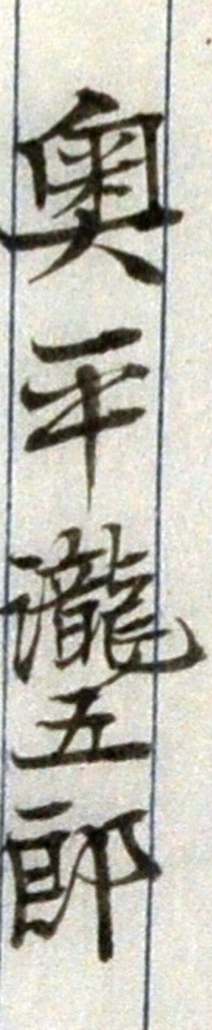奥平瀧五郎
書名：竹内流・甲州流・荒木流・一刀流新当流起請文及免許写堤宝山流手鏡及個之大事
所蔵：伊那市立高遠町図書館・合同会社AMANE
